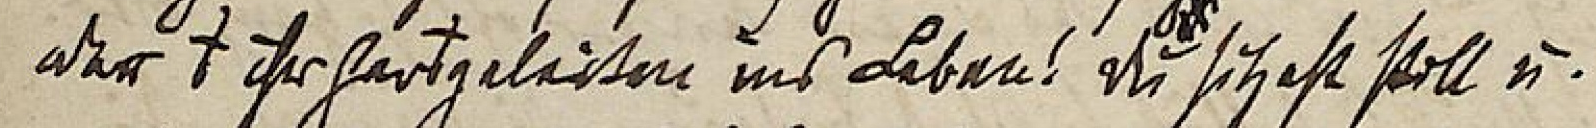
oder s. ihr herageleiten ins Leben! Du sitzest still u.
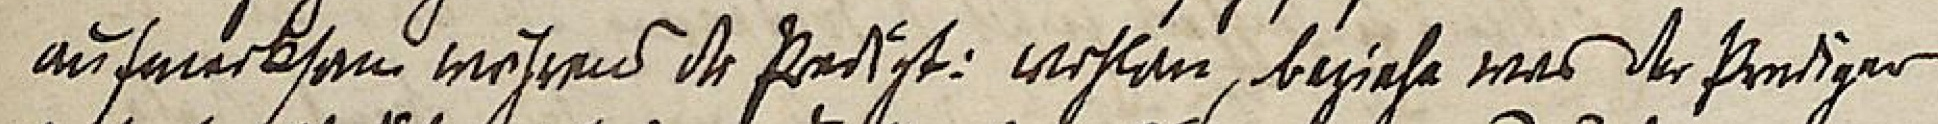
aufmerksam während der Predigt: wohlan, beziehe was der Prediger
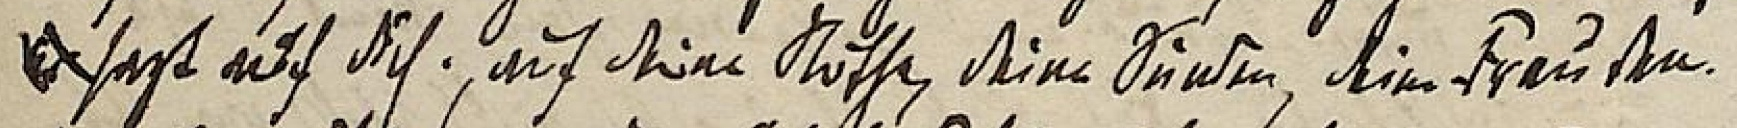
dir sagt auf dich, auf deine Nöthe, deine Sünden, deine Freuden.
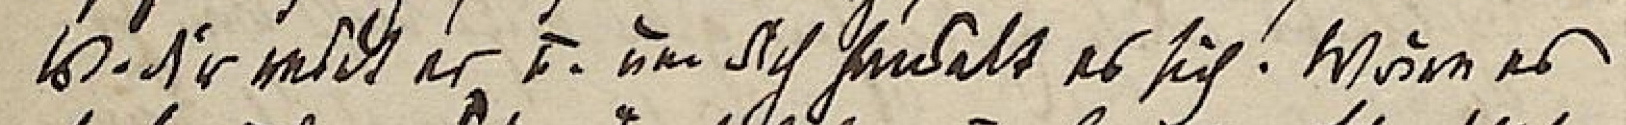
V. dir redet er u um dich handelt es sich. Wäre es
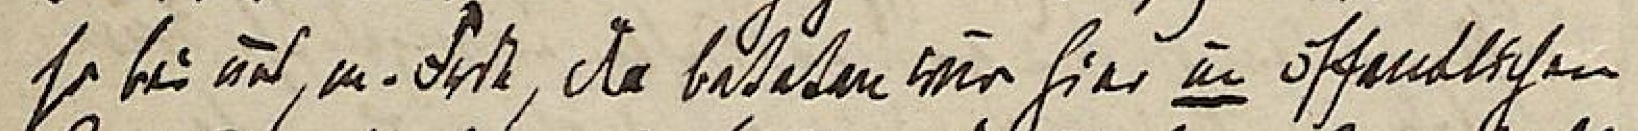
so bei uns, m. Frde, da beteten wir hier im öffentlichen
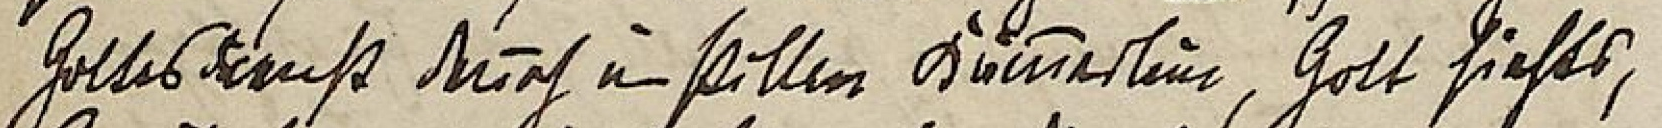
Gottesdienst denoch im stillen Kämmerlein, Gott siehts,
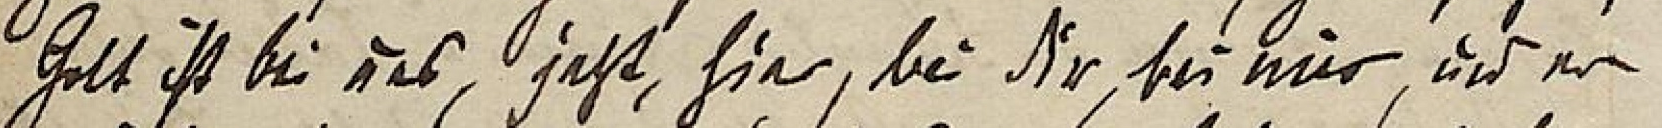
Gott ist bei uns, jetzt, hier, bei dir, bei mir und er
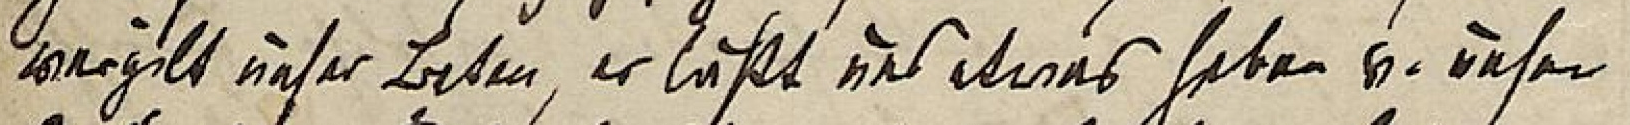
vergilt unser Beten, er läßt uns etwas haben v. unserm
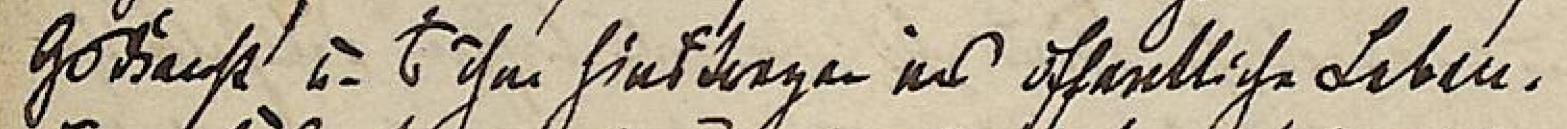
Gsdienst u. s ihm hinstragen ins öffentliche Leben.
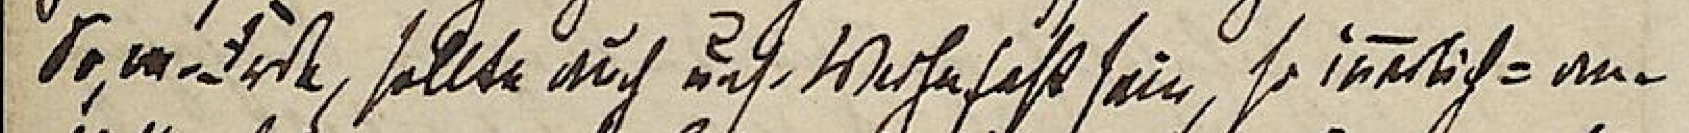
So, m. Frde, sollt auch uns. Weihnfest sein, so inerlich-an¬
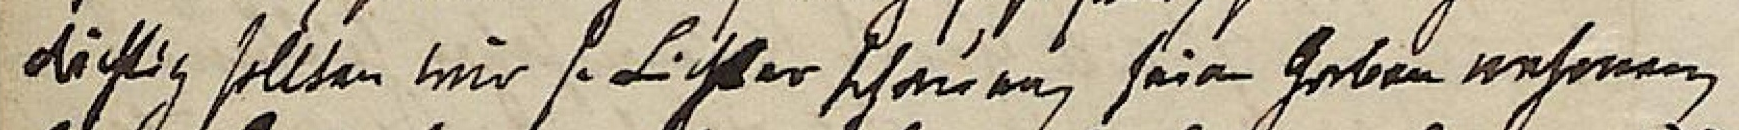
dächtig sollten wir sn Lichter schauen, seine Gaben nehmen,
